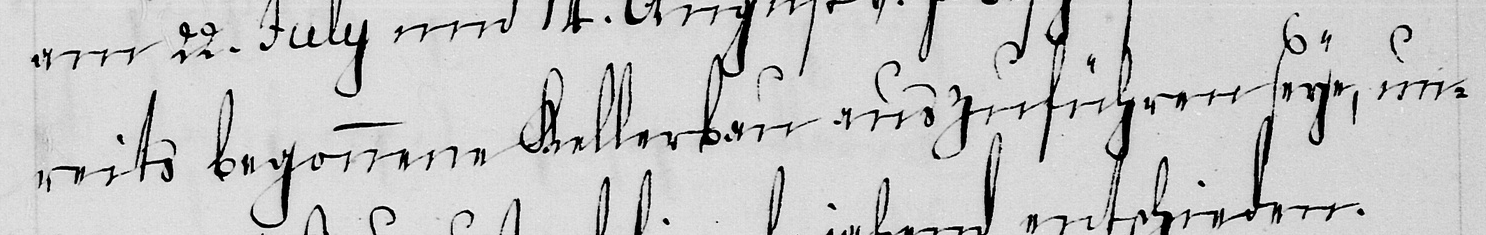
reits begonnene Kellerbau auszuführen seye, un¬
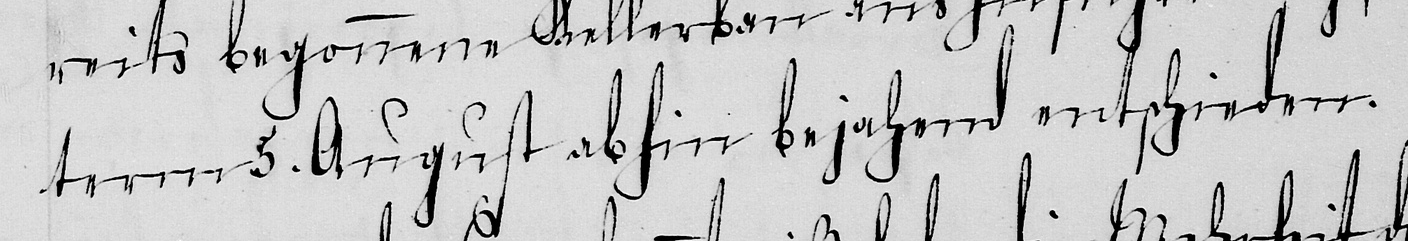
term 5. August abhin bejahend entschieden.
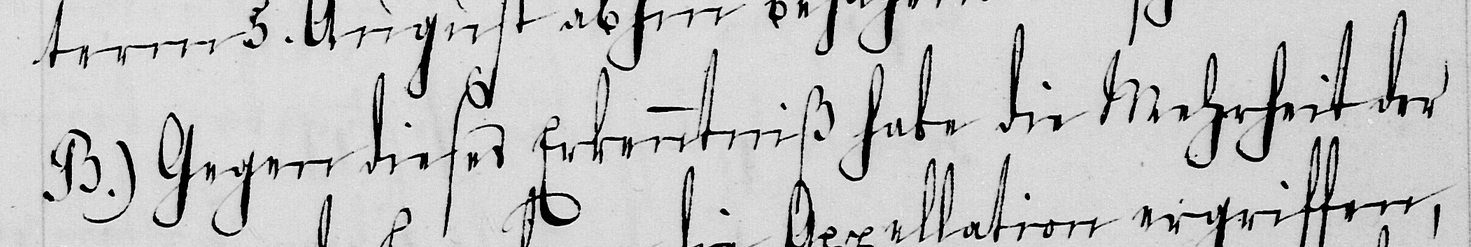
B.) Gegen dieses Erkenntniß habe die Mehrheit der
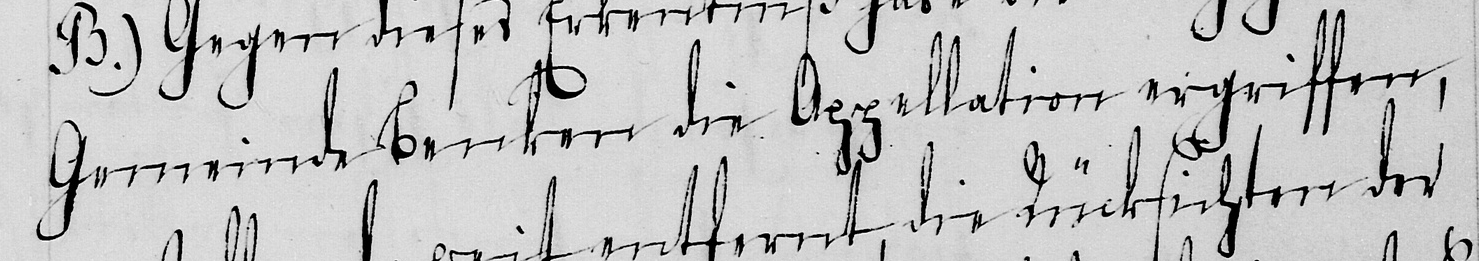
Gemeinde Benken die Appellation ergriffen,
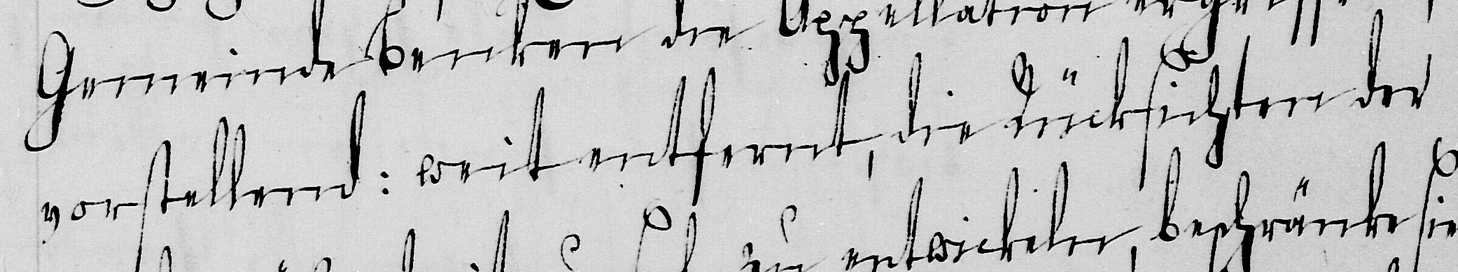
vorstellend: weit entfernt, die Rücksichten der
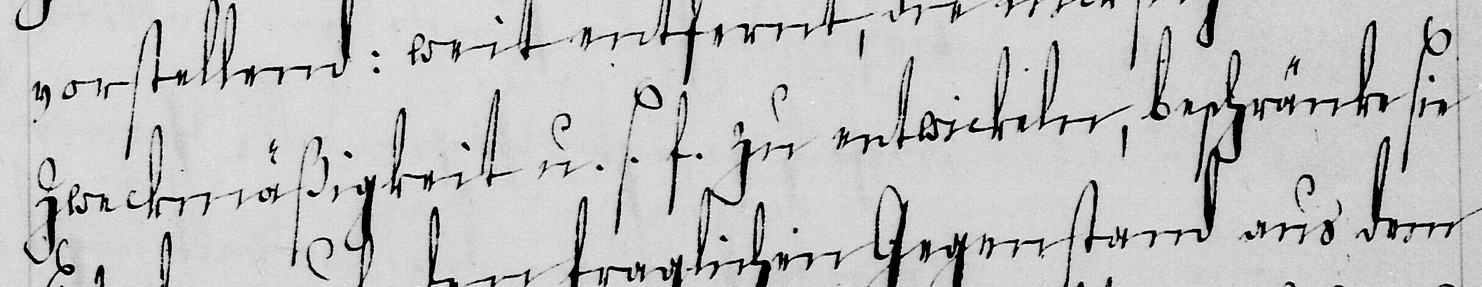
Zweckmäßigkeit u. s. f. zu entwickeln, beschränke
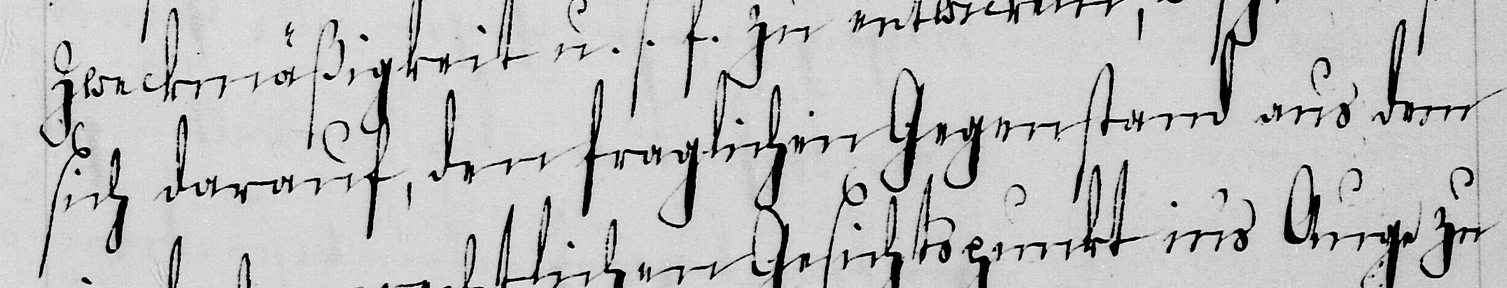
sich darauf, den fraglichen Gegenstand aus dem
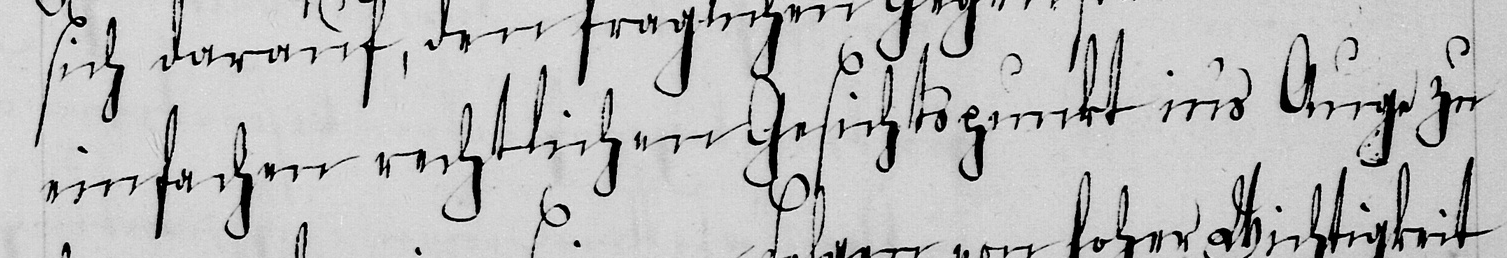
einfachen rechtlichen Gesichtspunkt in’s Auge zu
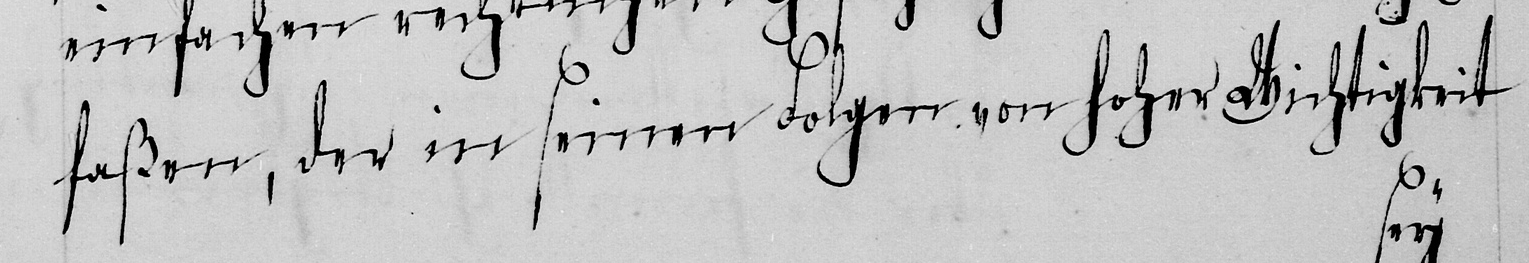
faßen, der in seinen Folgen von hoher Wichtigkeit
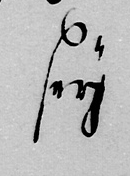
sie
